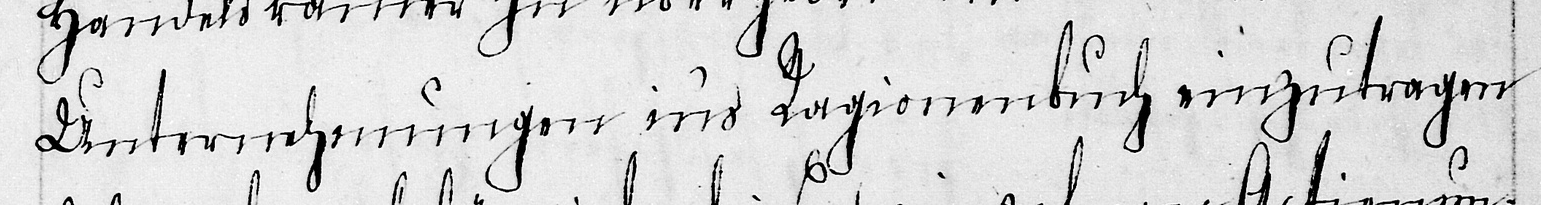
Unternehmungen in’s Ragionenbuch einzutragen
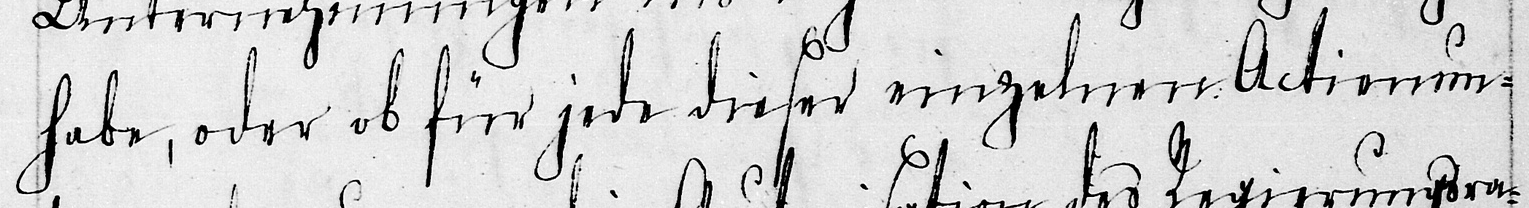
habe, oder ob für jede dieser einzelnen Actienun¬
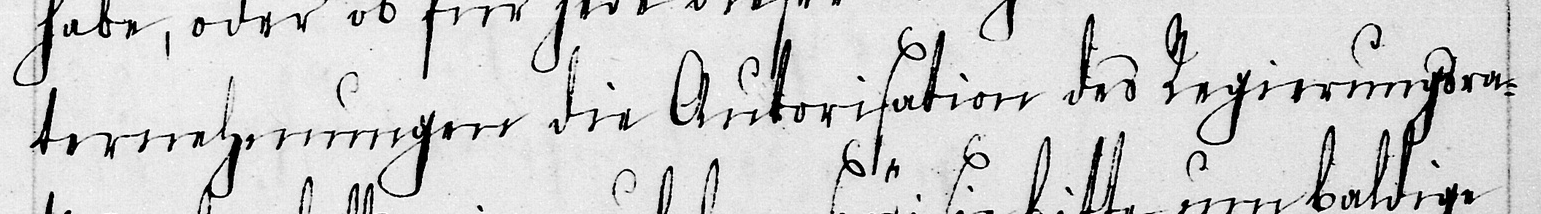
ternehmungen die Autorisation des Regierungsra¬
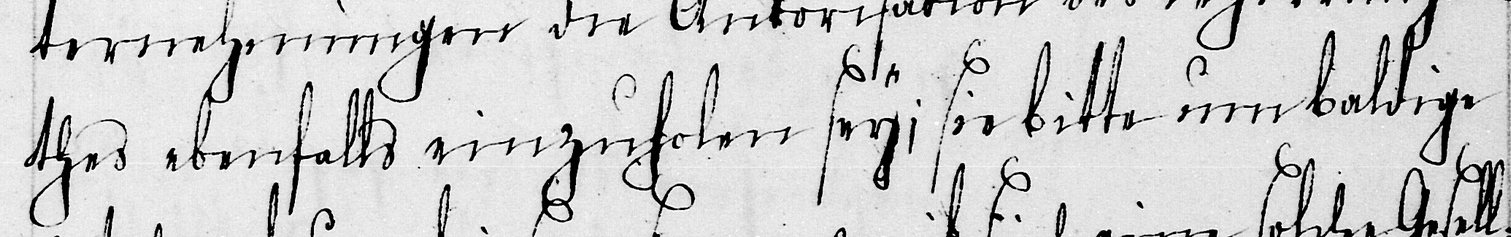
thes ebenfalls einzuholen sey; sie bitte um baldige
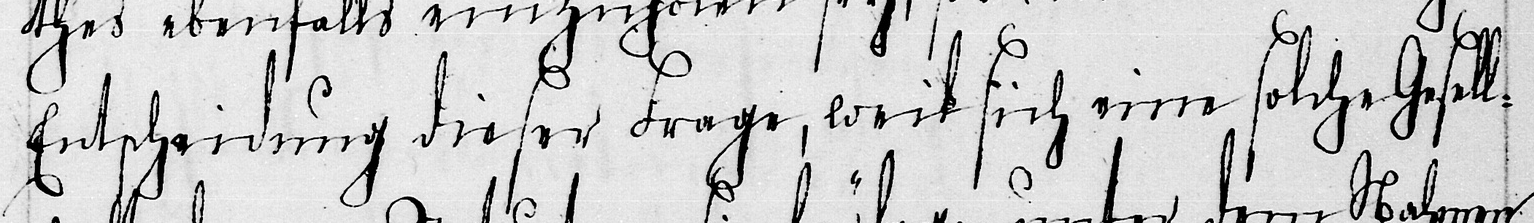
Entscheidung dieser Frage, weil sich eine solche Gesel¬
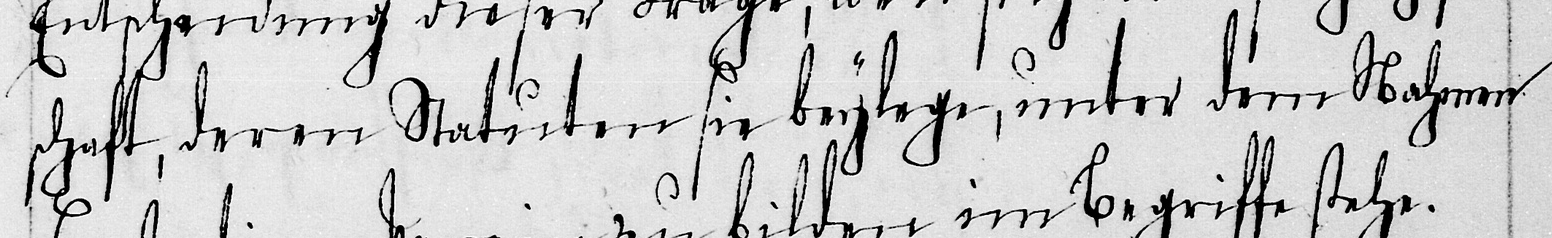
schaft, deren Statuten sie beylege, unter dem Nahmen
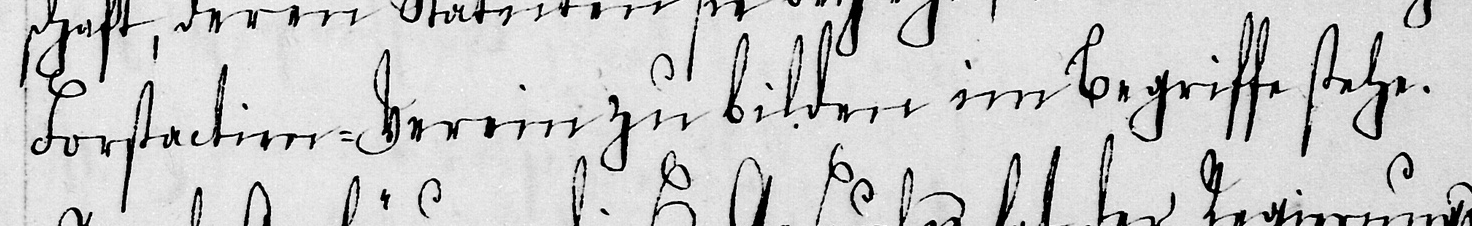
Forstactien-Verein zu bilden im Begriffe stehe.
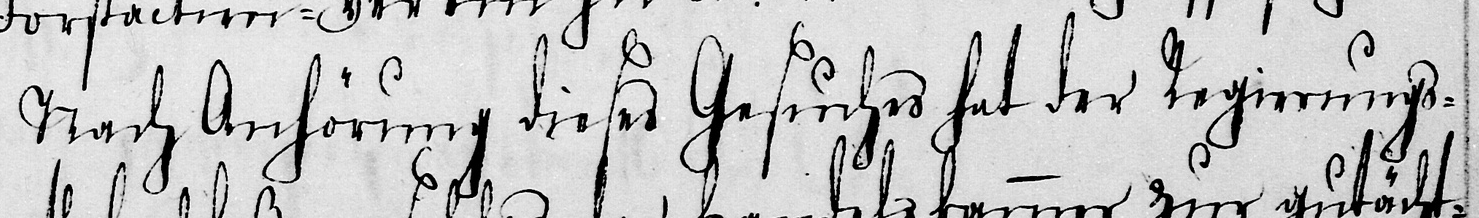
Nach Anhörung dieses Gesuches hat der Regierungs¬
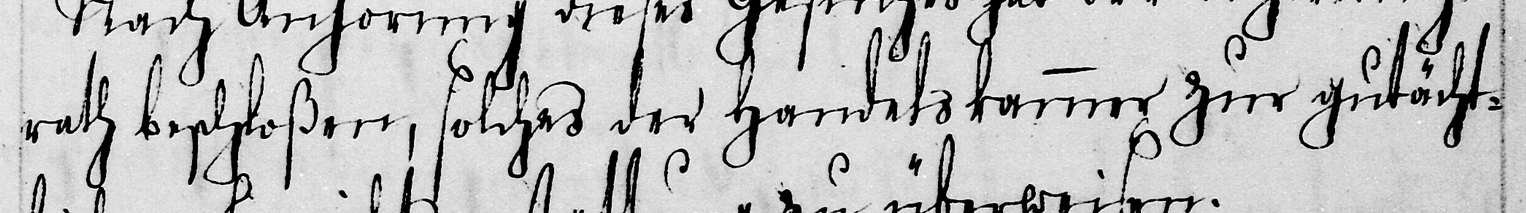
rath beschloßen, solches der Handelskammer zur gutächt¬
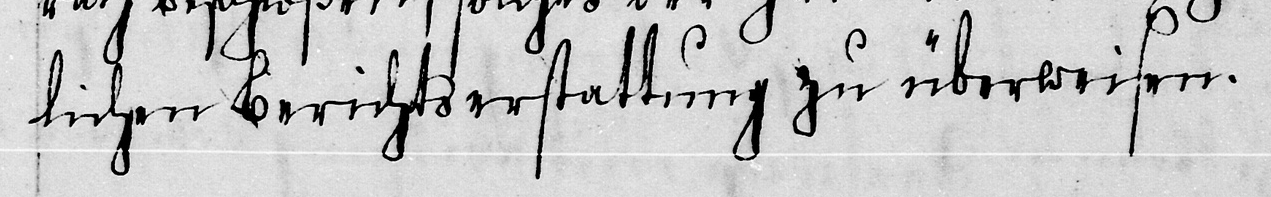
lichen Berichtserstattung zu überweisen.
